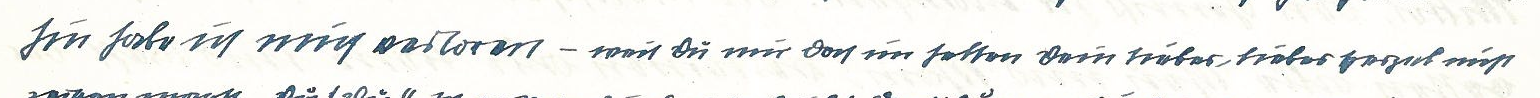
hin habe ich mich verloren – weil Du doch im Hellen Dein liebes, liebes Herzel nicht
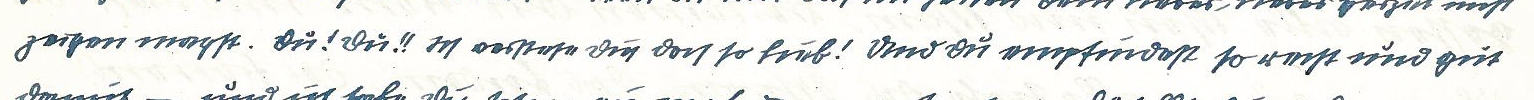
zeigen magst. Du! Du!! Ich verstehe Dich doch so lieb! Und Du empfindest so recht und gut
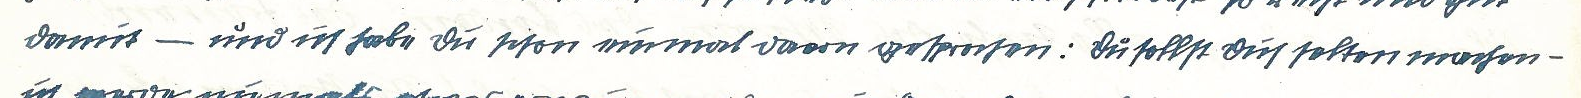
damit – und ich habe Dir schon einmal davon gesprochen: Du sollst Dich selten machen –
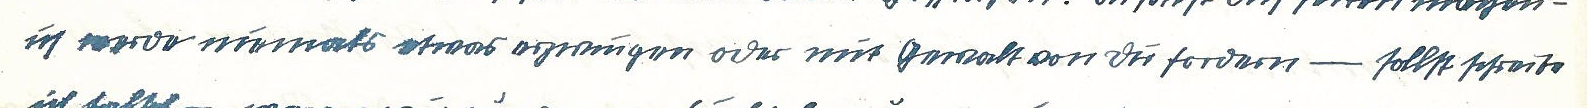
ich werde niemals etwas erzwingen oder mit Gewalt von Dir fordern – sollst schreibe
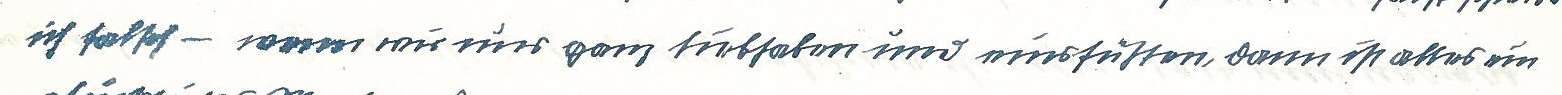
ich falsch – wenn wir uns ganz liebhaben und einsfühlen, damit ist alles ein
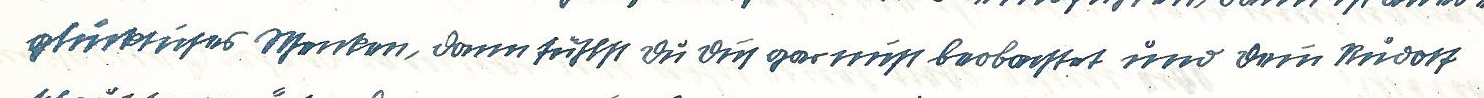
glückliches Schenken, dann fühlst Du Dich gar nicht beobachtet und Dein Rudolf
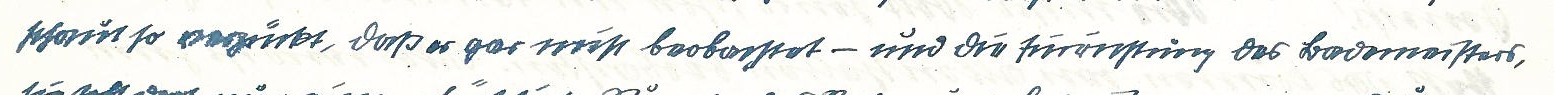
schaut so verzückt, daß er gar nicht beobachtet – und die Einrichtung des Bademeisters,
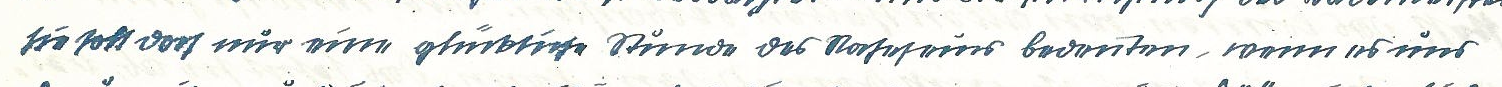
sie soll doch nur eine glückliche Stunde des Naheseins bedeuten, wenn es nur
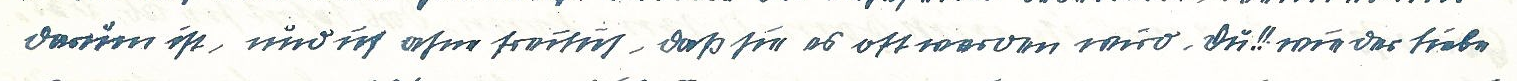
darum ist, und ich ahne freilich, daß sie es oft werden wird, Du!! wie der liebe
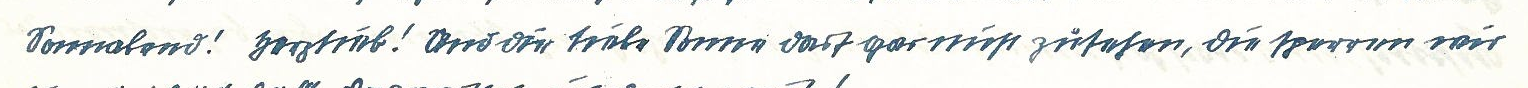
Sonnabend! Herzlieb! Und die liebe Sonne darf gar nicht zusehen, die sperren wir
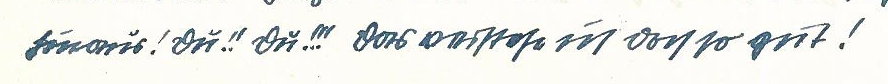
hinaus! Du!! Du!!! Das verstehe ich doch so gut!
